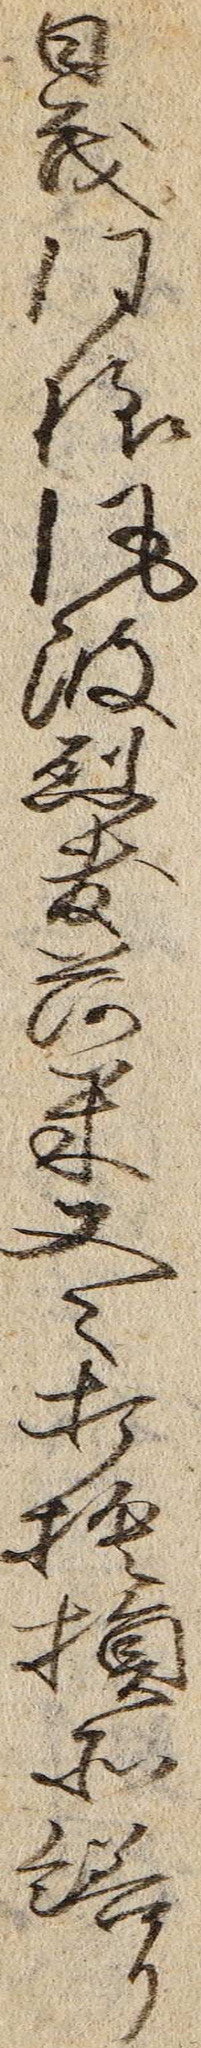日も同様風波烈しく荷米又々打捨損所繕り
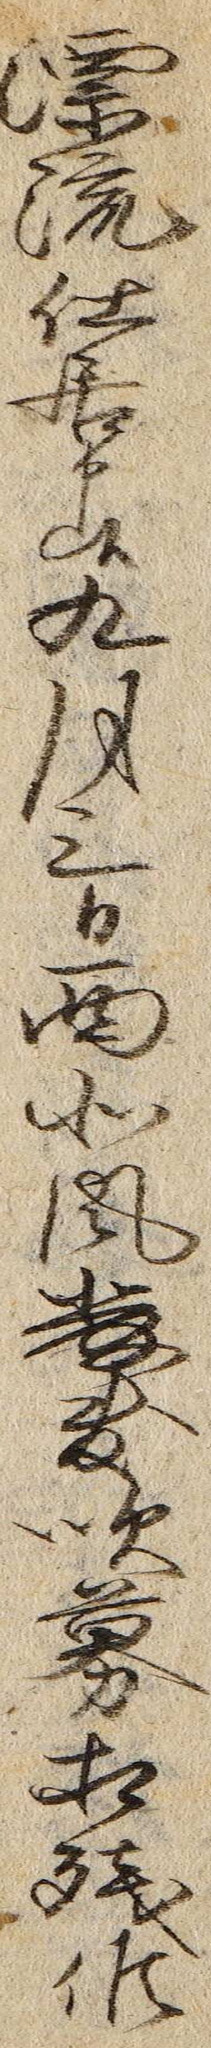漂流仕居申候九月三日西北風厳しく吹募相残候
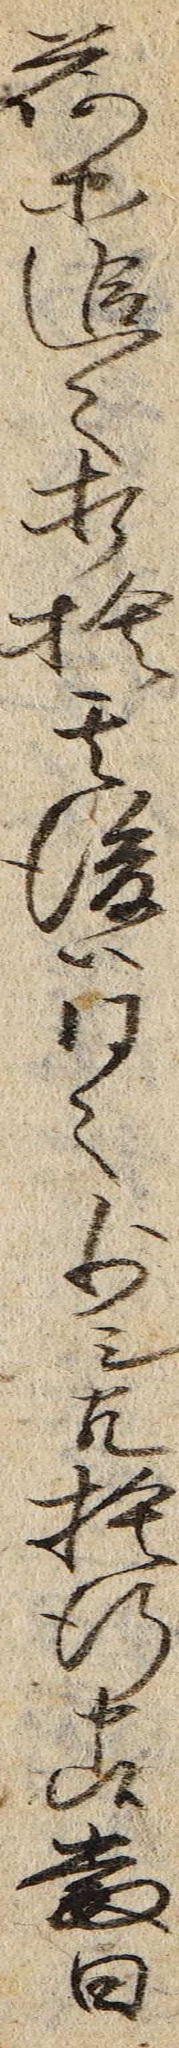荷米追々打捨其後は日々少し宛捨行申候数日
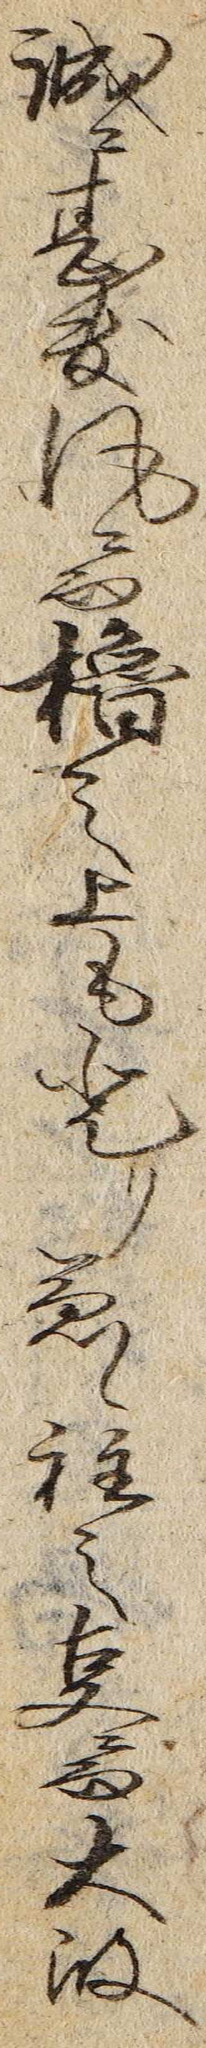誠に甚しき風にて櫓の上も登り兼候程の事にて大波
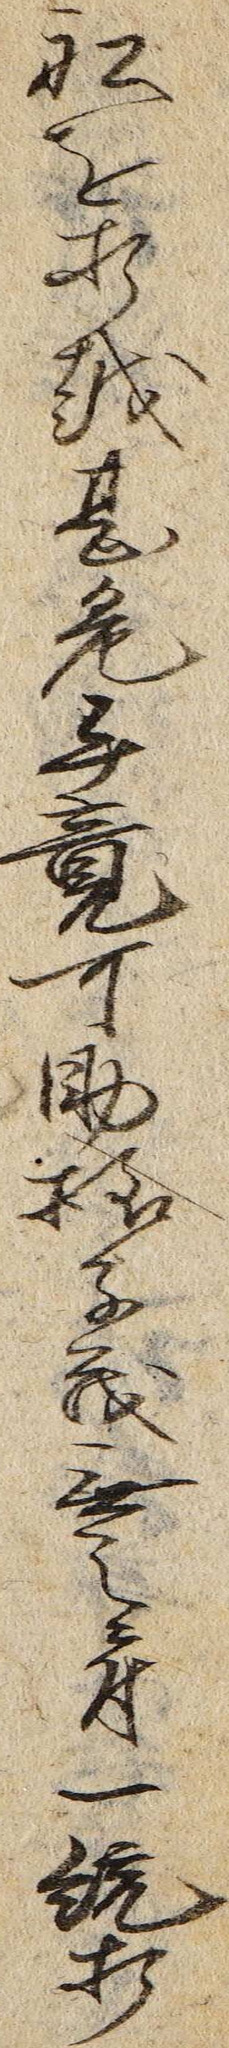船を打越甚危畢竟可助様子も無之に付一統打
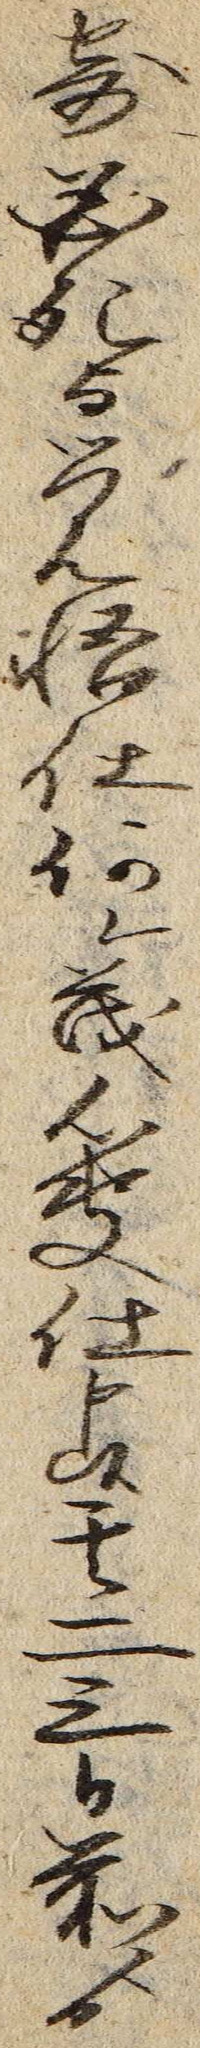寄必死と覚悟仕何レも心決仕申候其二三日前より
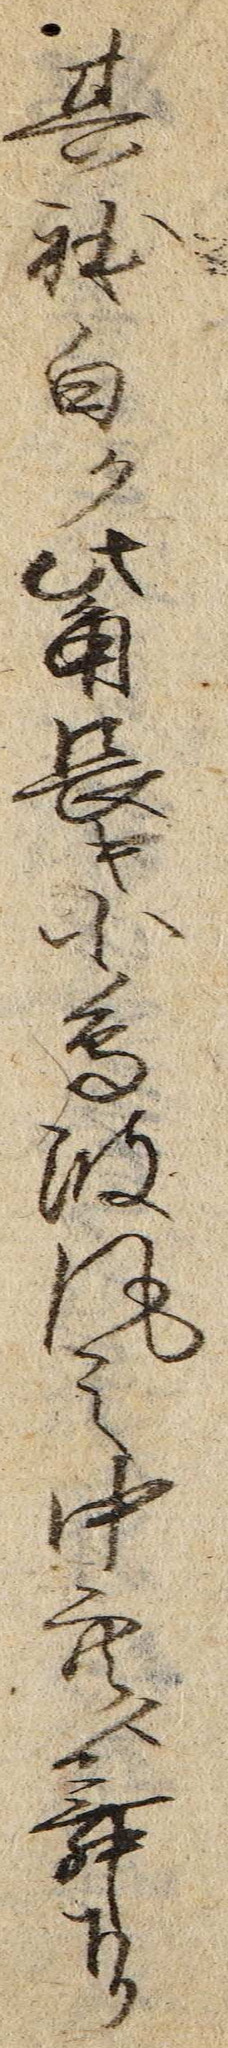其体白く觜長き小鳥波風の中空より舞下り

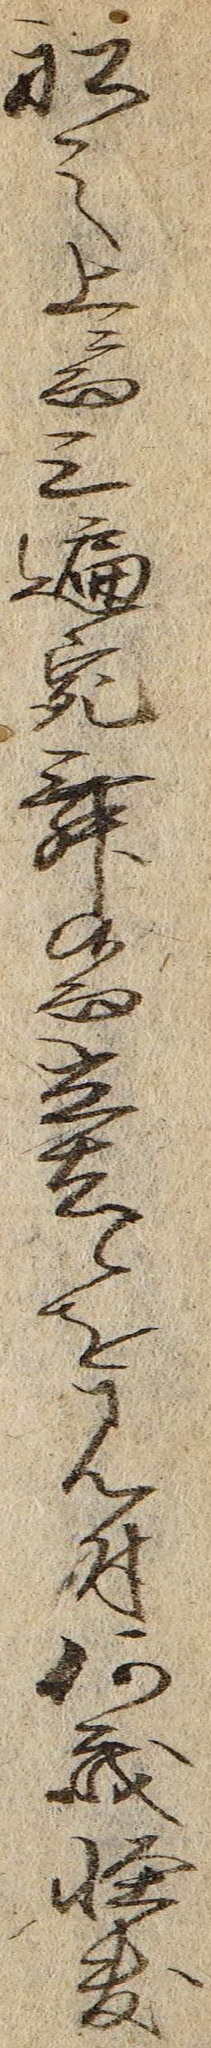船の上にて三遍宛舞候て立去候を見付何も怪しく
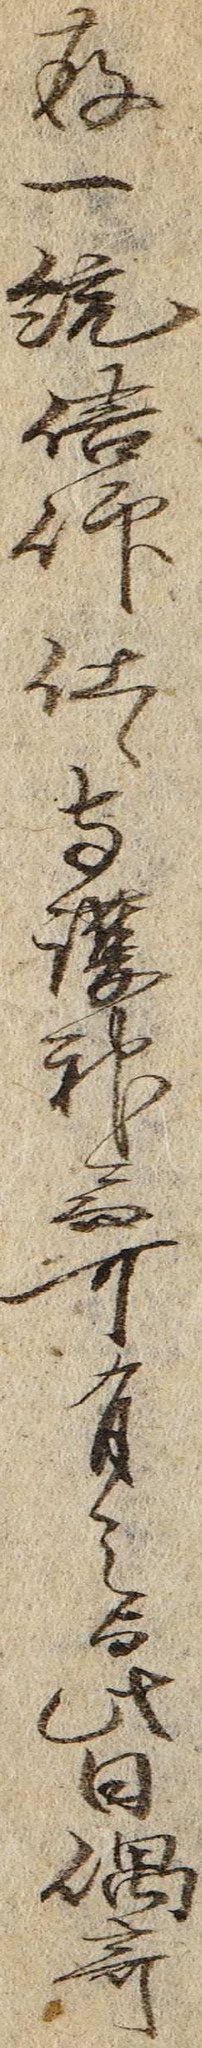存一統信仰仕候守護神にて可有之と此日偶奇
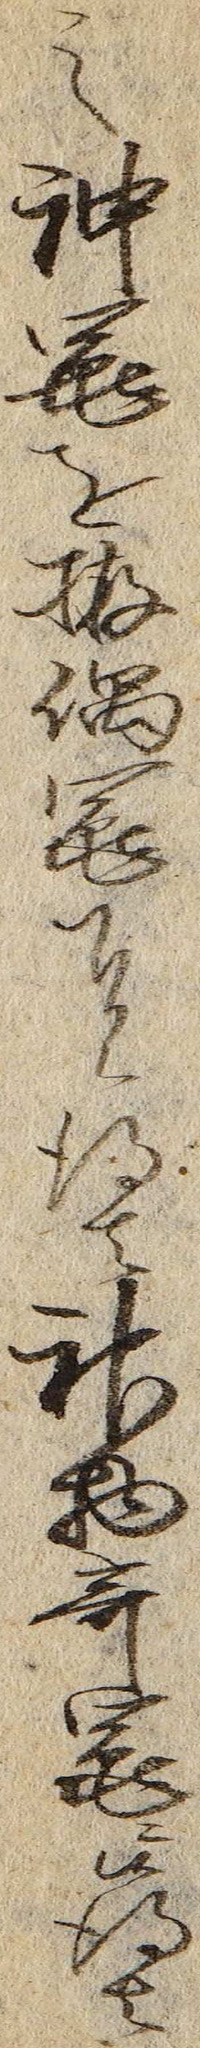之神鬮を拵偶鬮下り候得ば神物奇鬮に候得ば
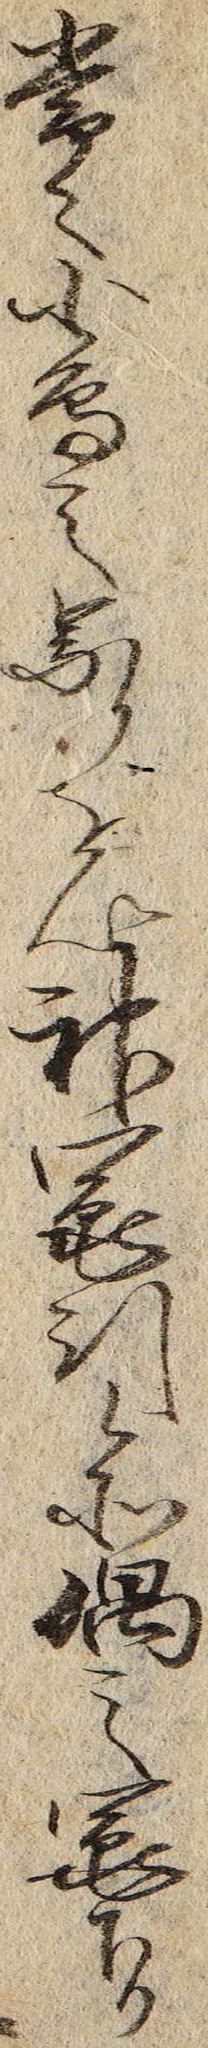常々小鳥の参りを以神鬮引候所偶之鬮下り
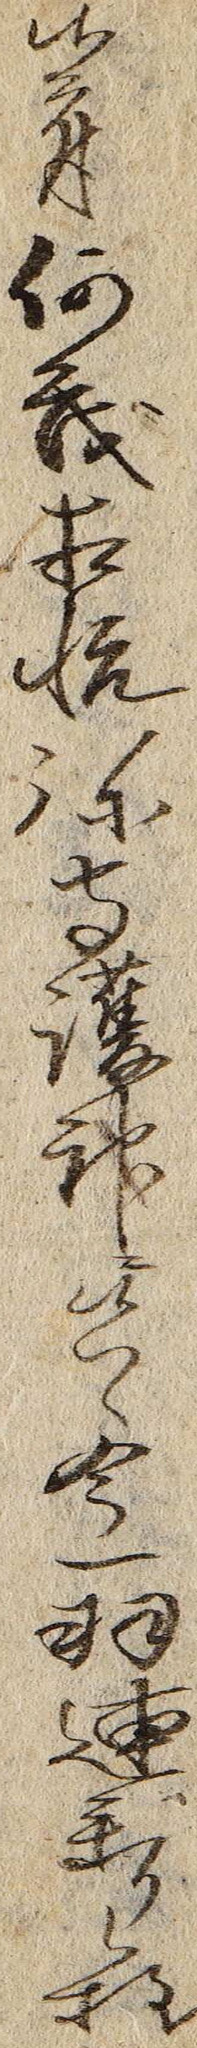候に付何も相悦弥守護神に候はば今一羽連参り候様
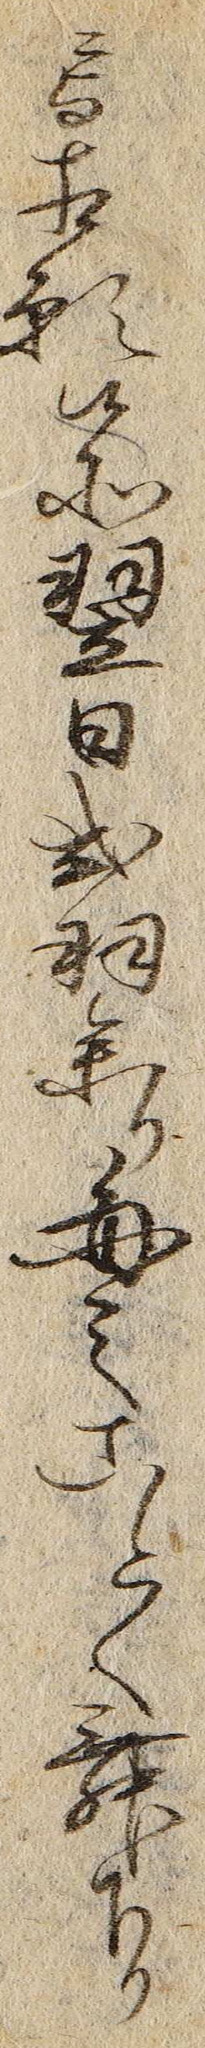にと相願候所翌日二羽参り毎のことく舞下り
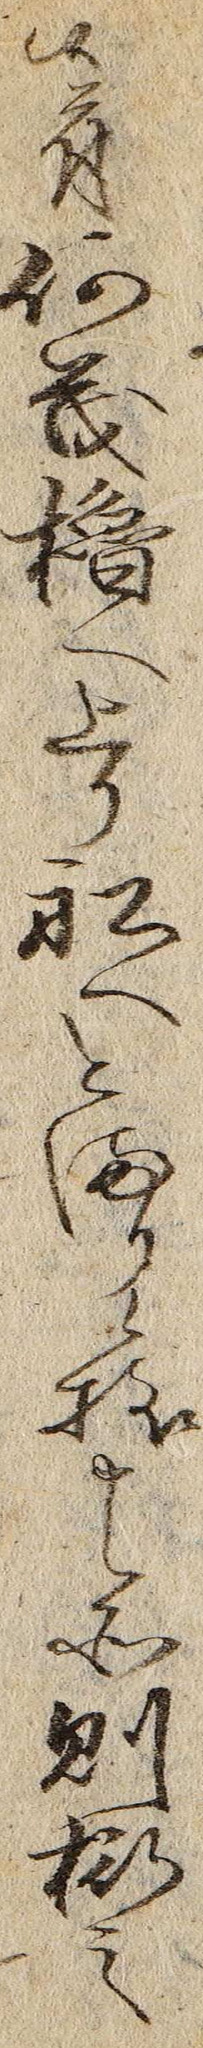候に付何も櫓へ上り船へとまり候様申候所則桁の
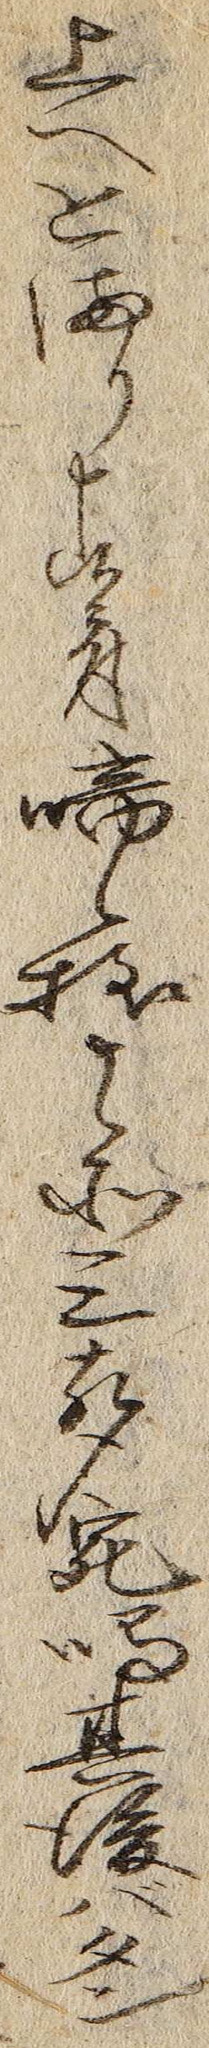上へとまり申候に付啼候様申候所三声宛鳴其後バタン
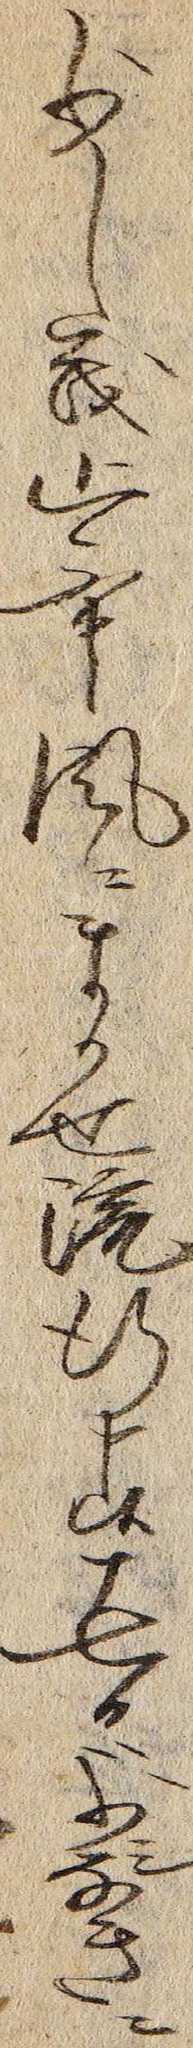少しも止不申風にまかせ流行申候十七日少しなきに
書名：能登国清兵衛異国江漂流之始末
